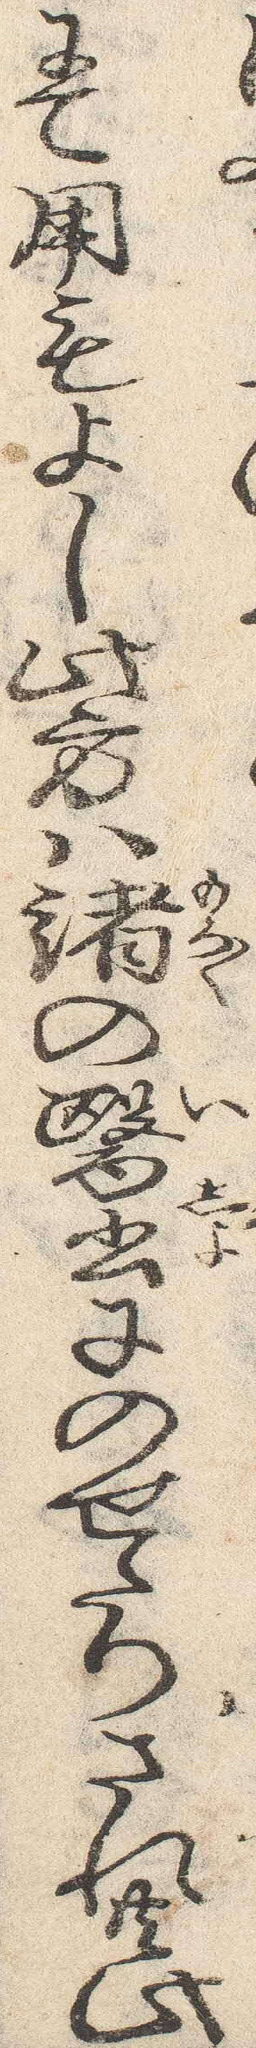にて用もよし此方は諸の医書にのせたりされ共此
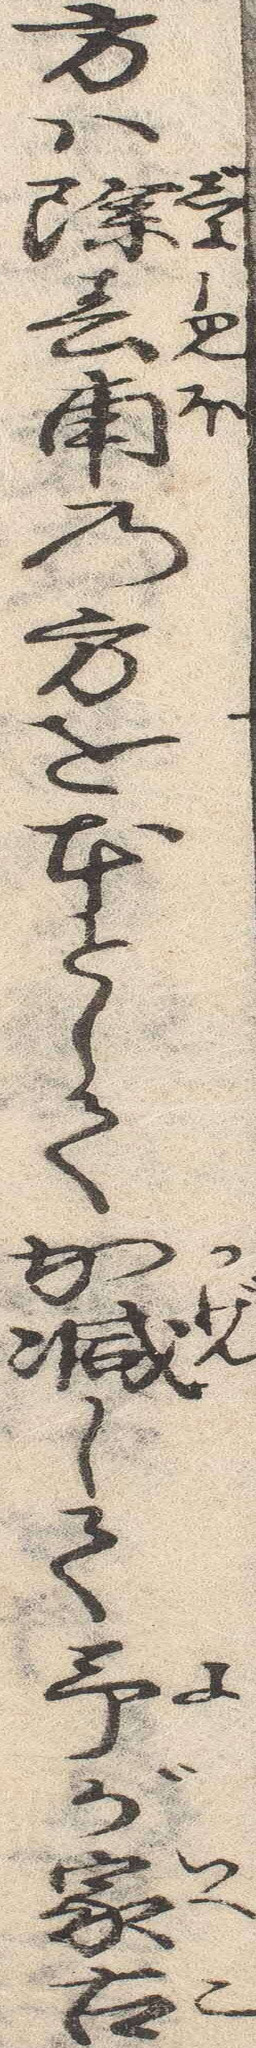方は除春甫の方を本として加減して予が家古
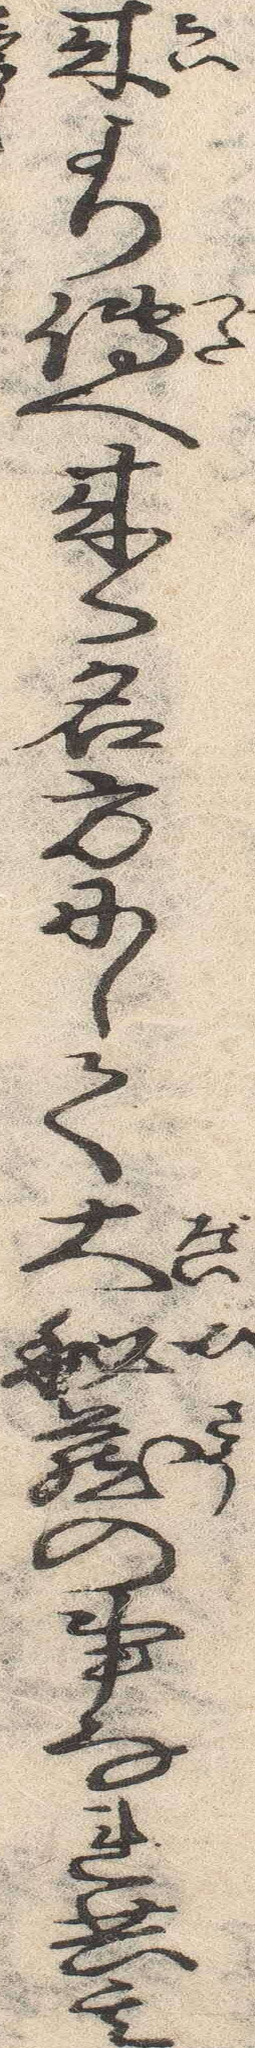来より伝へ来る名方にして大秘蔵の事なれ共其
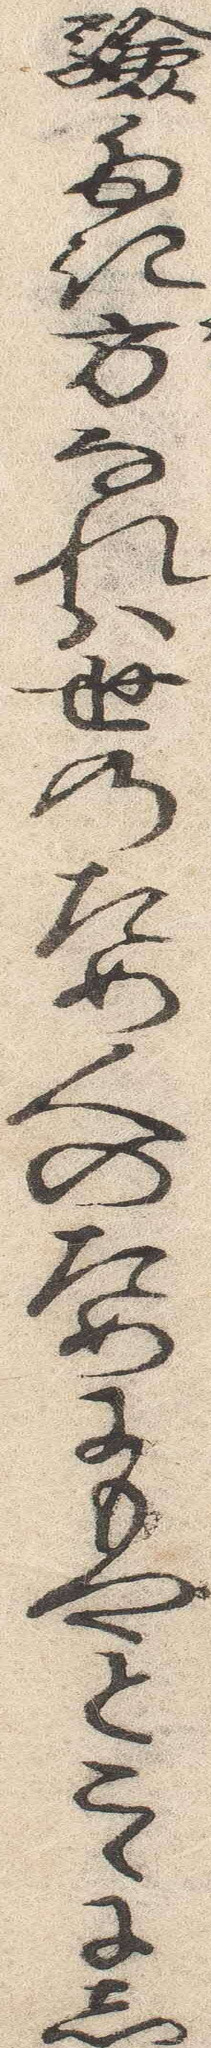験多き方なれは世のため人のためにもやとこゝにし
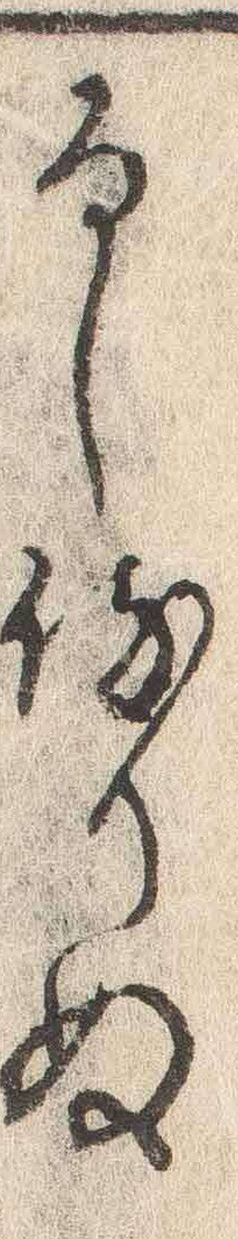るし侍りぬ
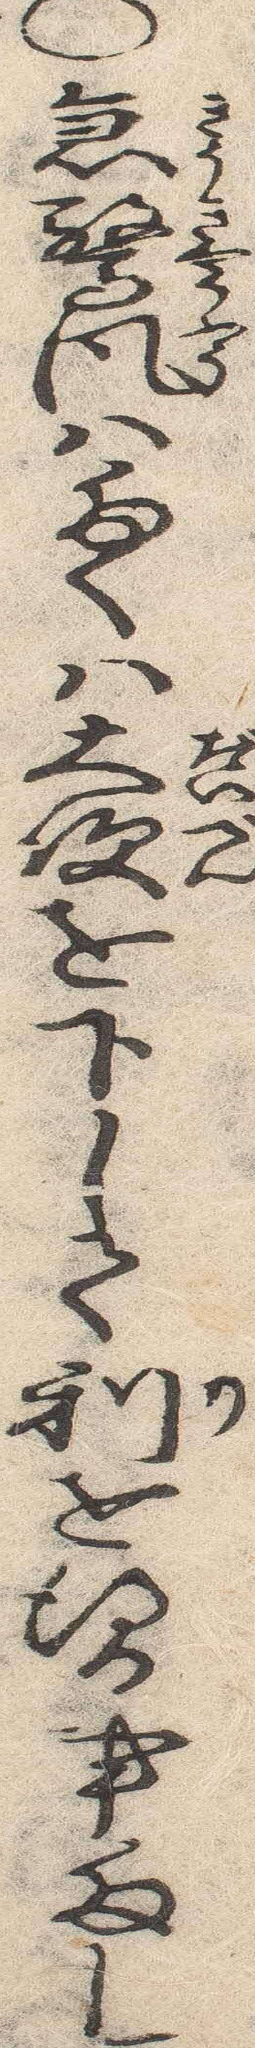○急驚風は多くは大便を下して利を得る事多し
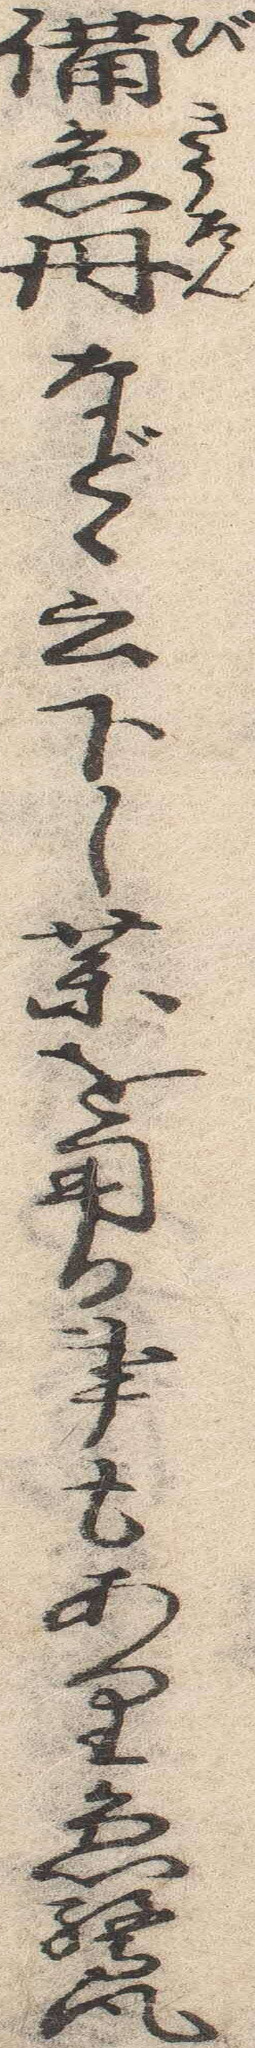備急丹などゝ云下し薬を用る事もあり急驚風
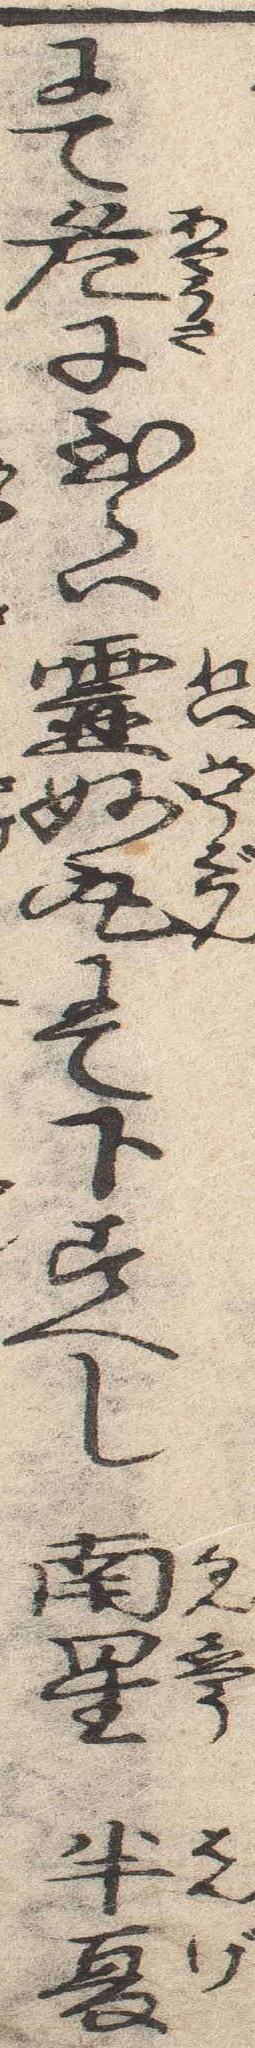にて危に至らは霊妙丸にて下すへし南星半夏
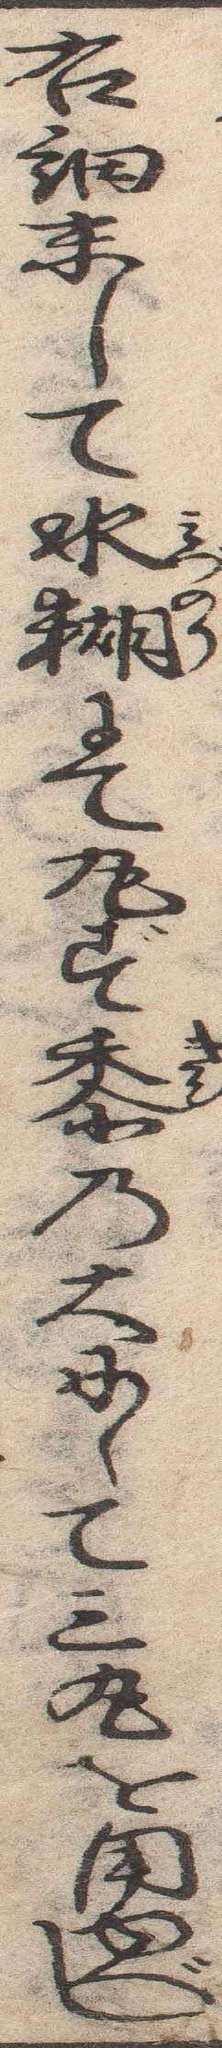右細末して水糊にて丸ず黍の大にして三丸を用ゆべし
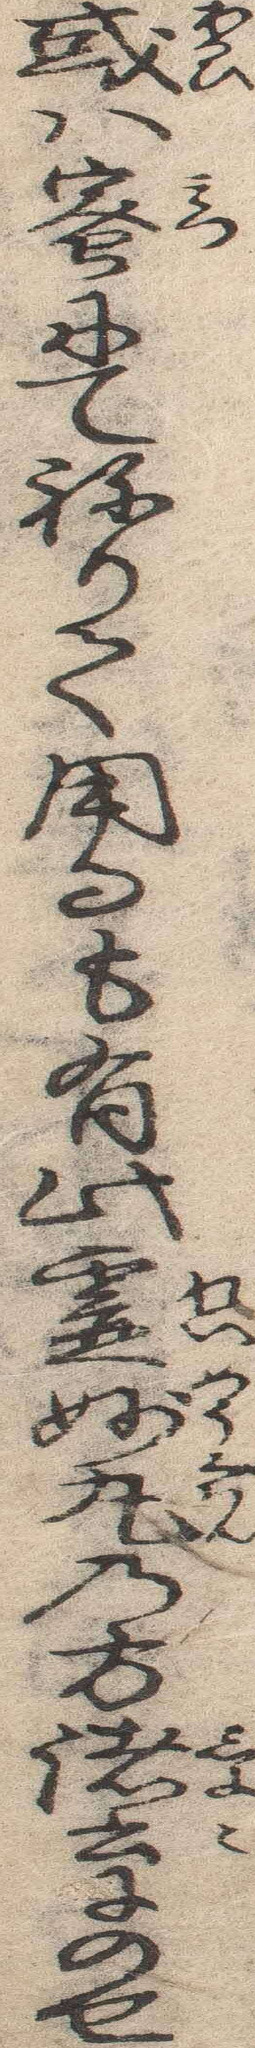或は蜜にてねりて用るも有此霊妙丸の方諸書にのせ

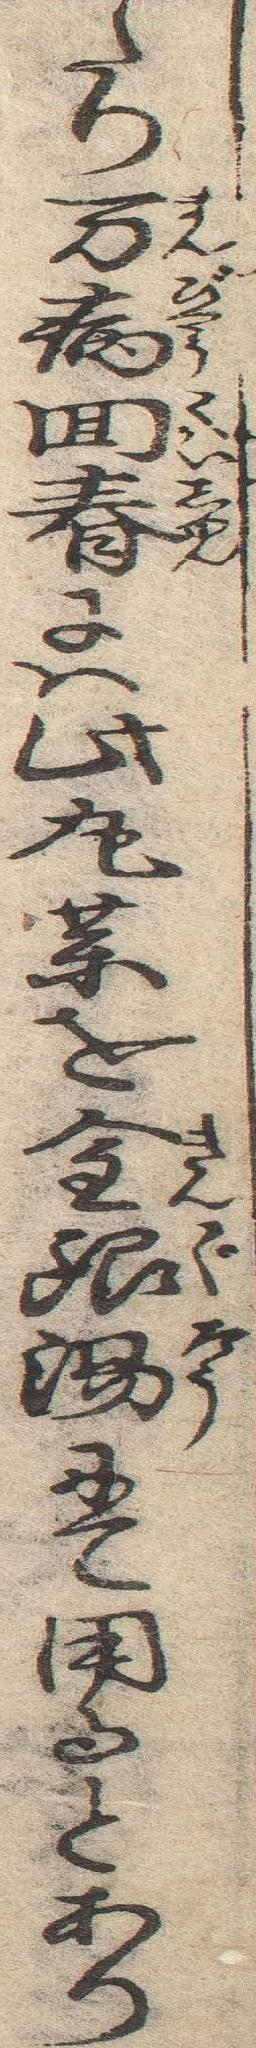たり万病回春には此丸薬を金銀湯にて用るとあり
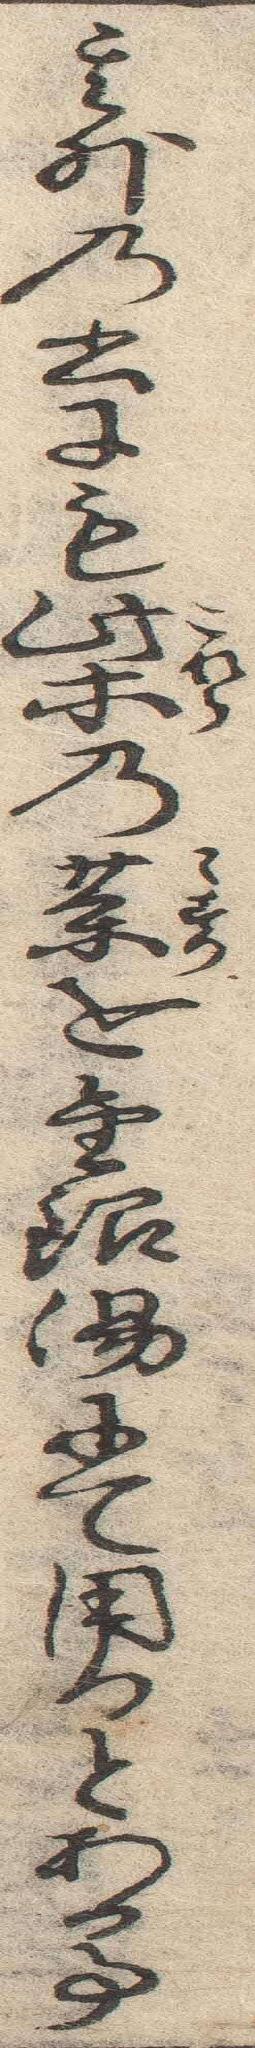其外の書にも此等の薬を金銀湯にて用るとある事
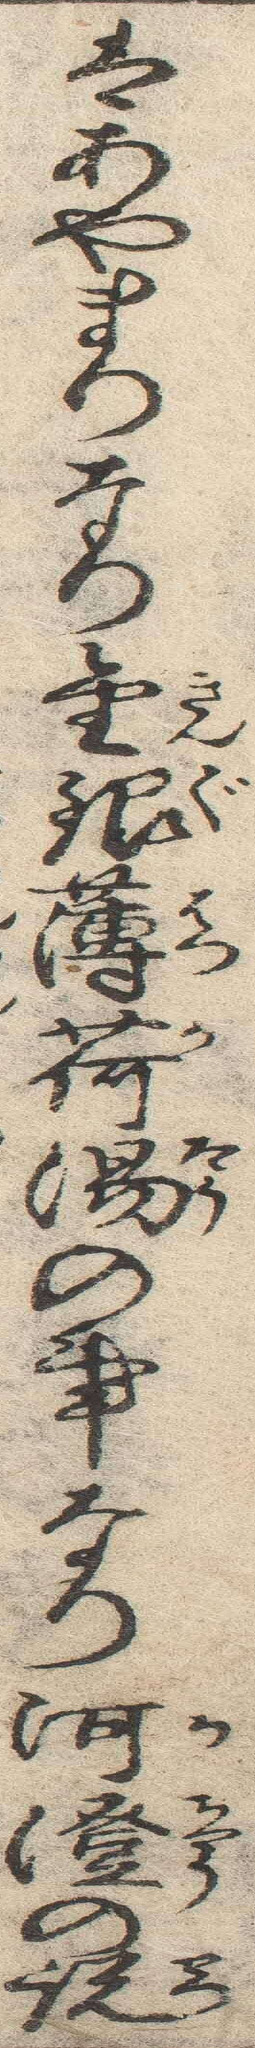はあやまりなり金銀薄荷湯の事なり河澄の説
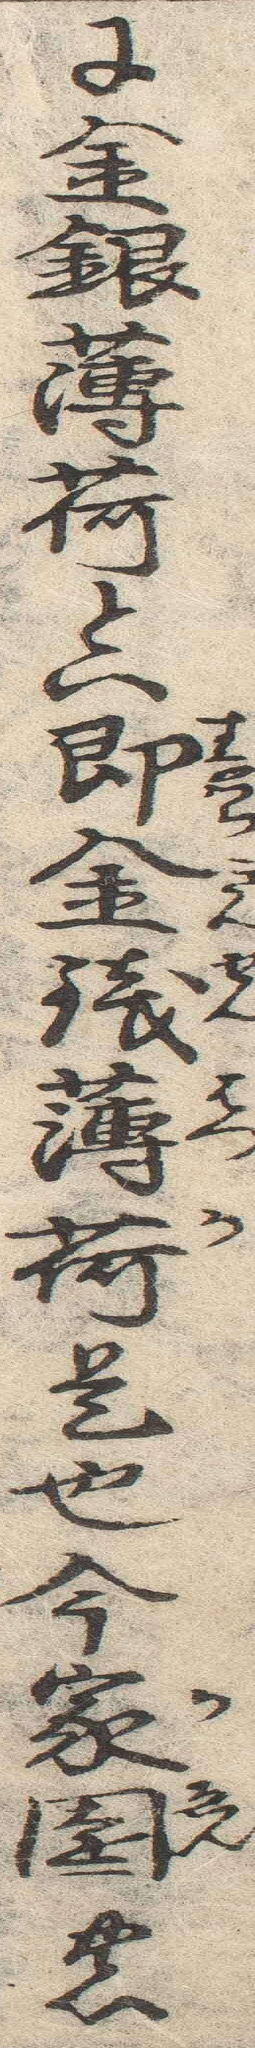に金銀薄荷とは即金銭薄荷是也今家園の
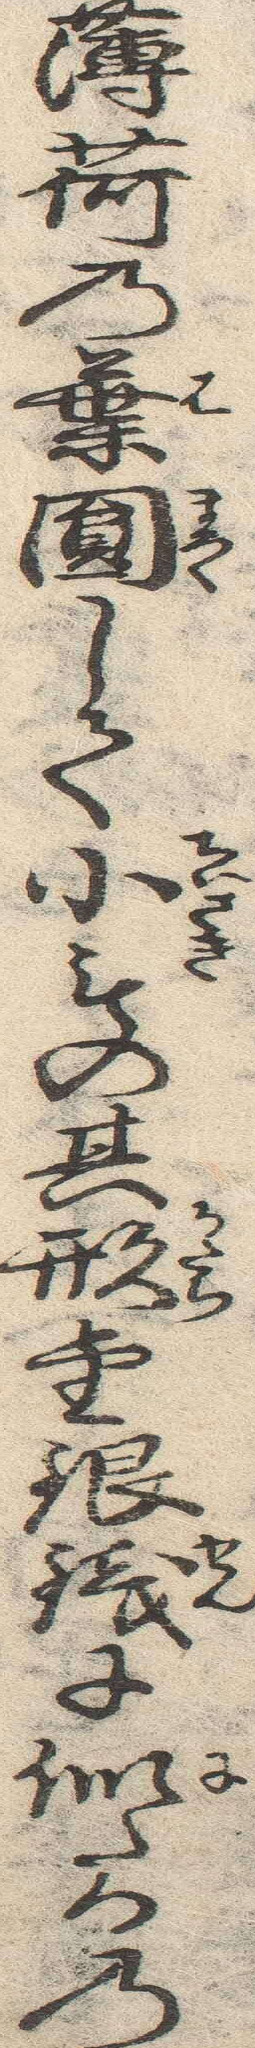薄荷の葉円して小もの其形金銀銭に似たるの
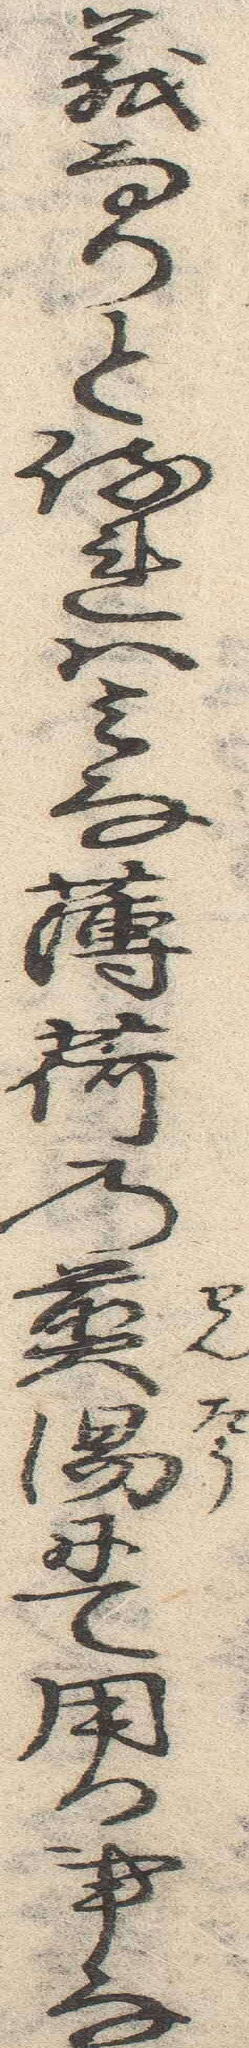義なりと侍れはみな薄荷の煎湯にて用る事な
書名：小児必用養育草
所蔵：東京学芸大学附属図書館 国文学研究資料館
